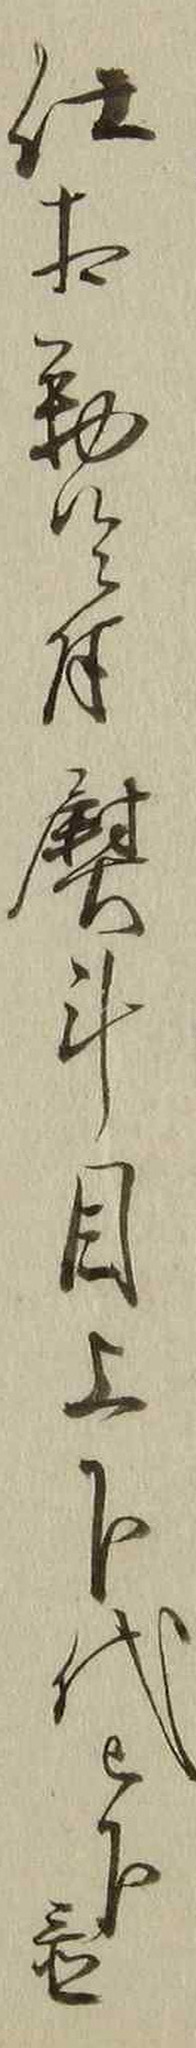仕相勤候に付熨斗目上下代被下置
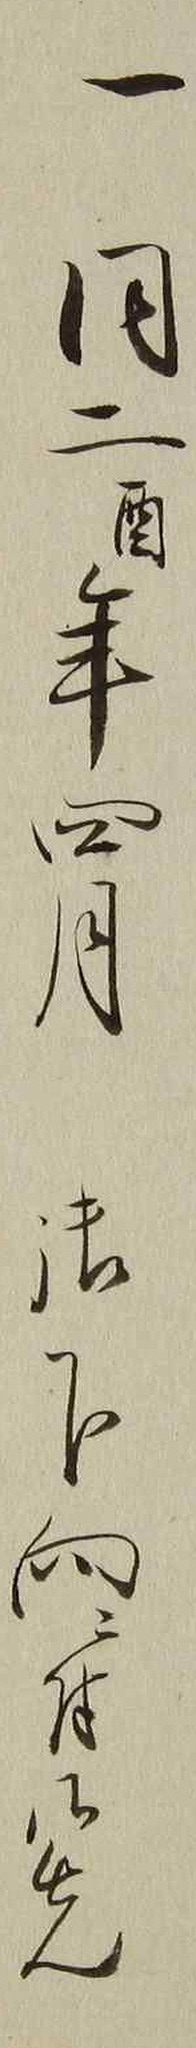一同二酉年四月御下向に付御先
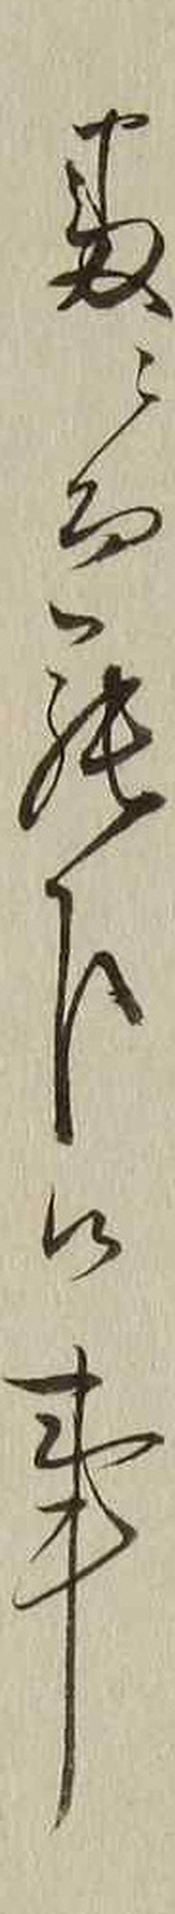番に而罷下候事
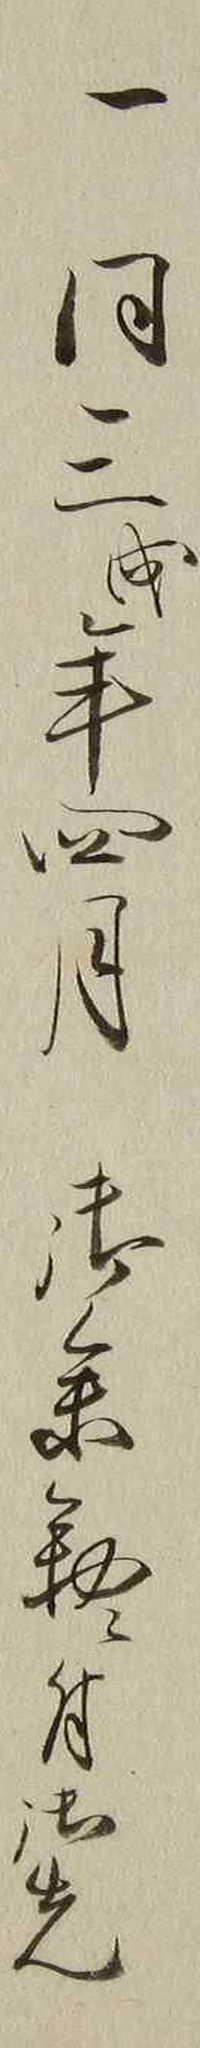一同三戌年四月御参勤に付御先
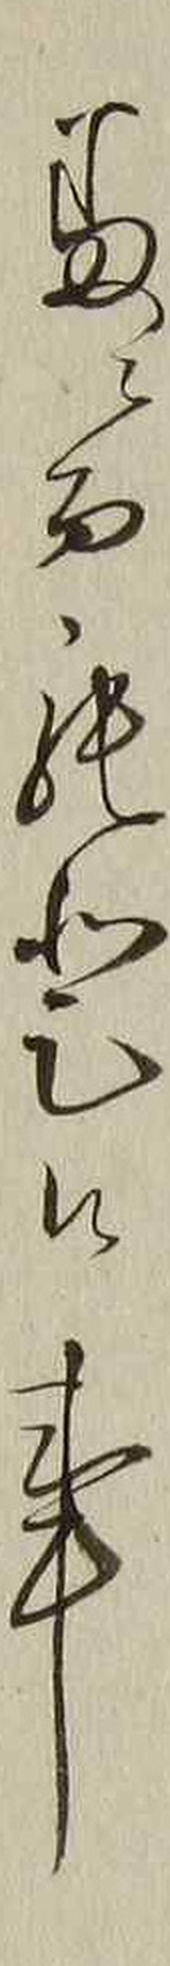番に而罷登候事
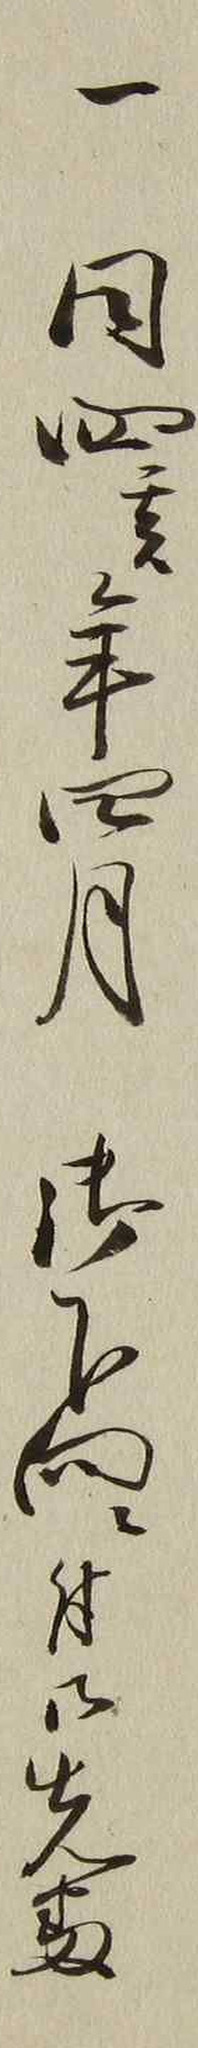一同四亥年四月御下向に付御先番
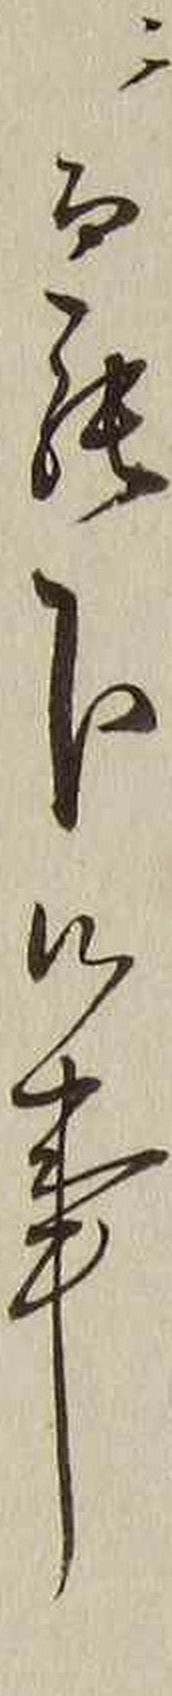に而罷下候事
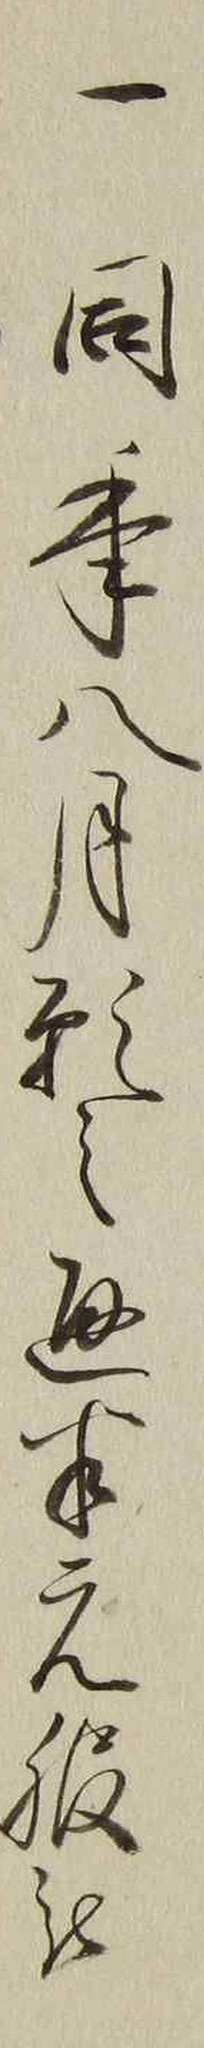一同年八月願之通半元服被
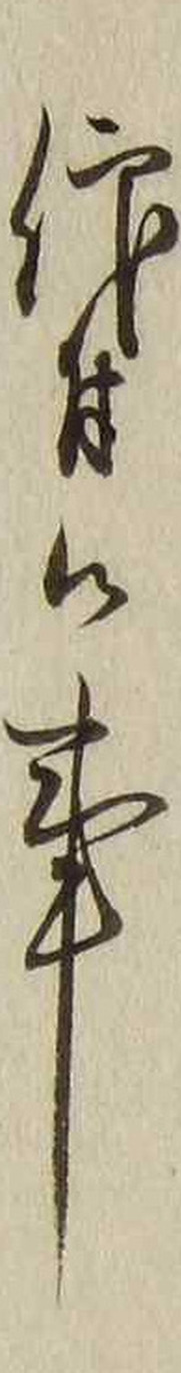仰付候事
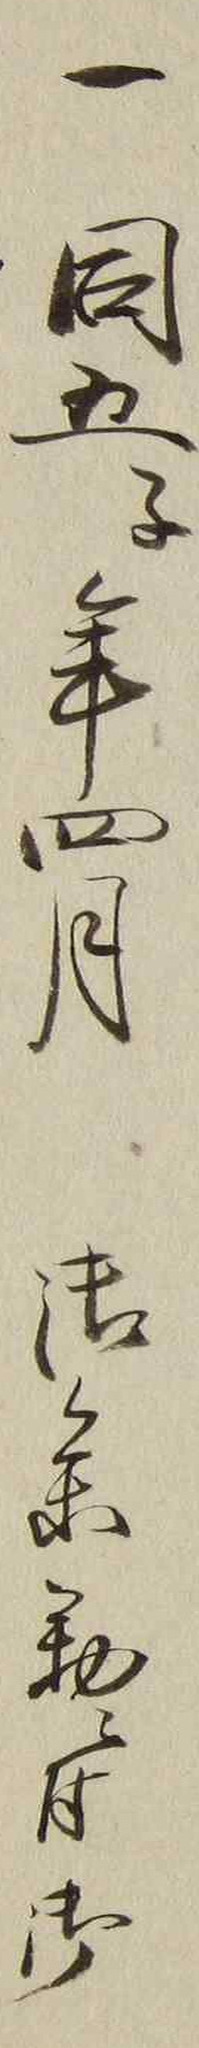一同五子年四月御参勤に付御
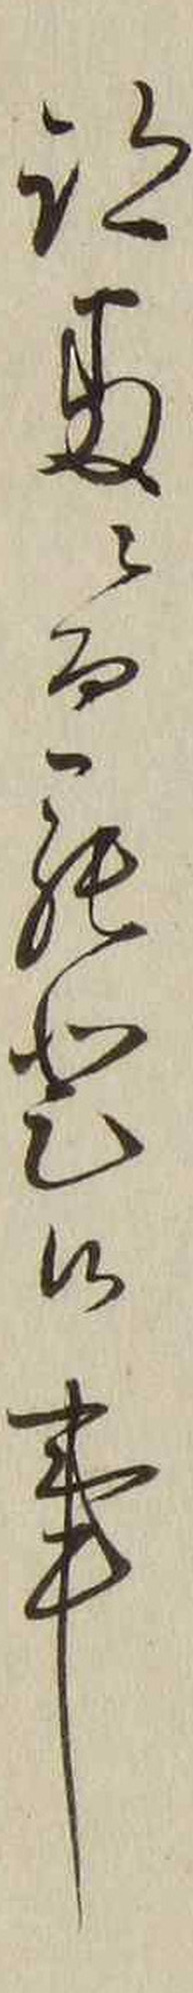跡番に而罷登候事

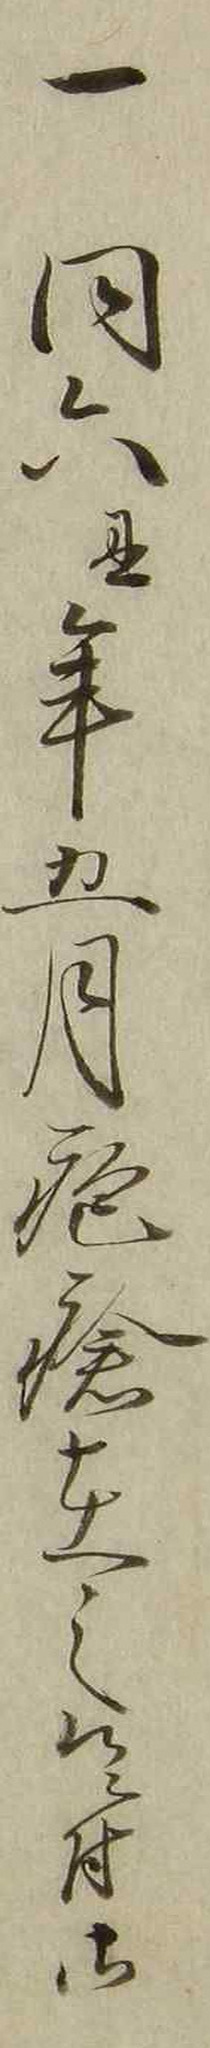一同六丑年五月疱瘡在之候に付御
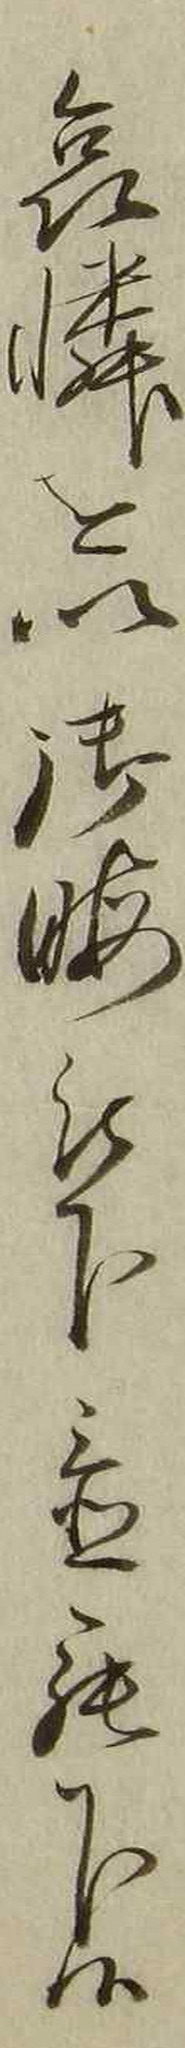哀憐を以御暇被下置罷下候
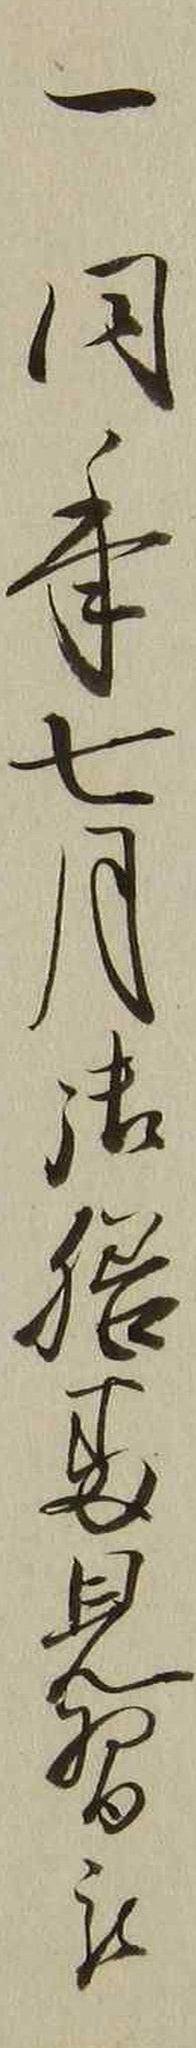一同年七月御膳番見習被
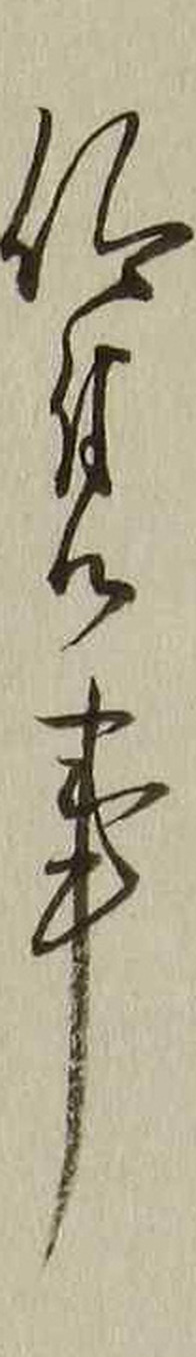仰付候事
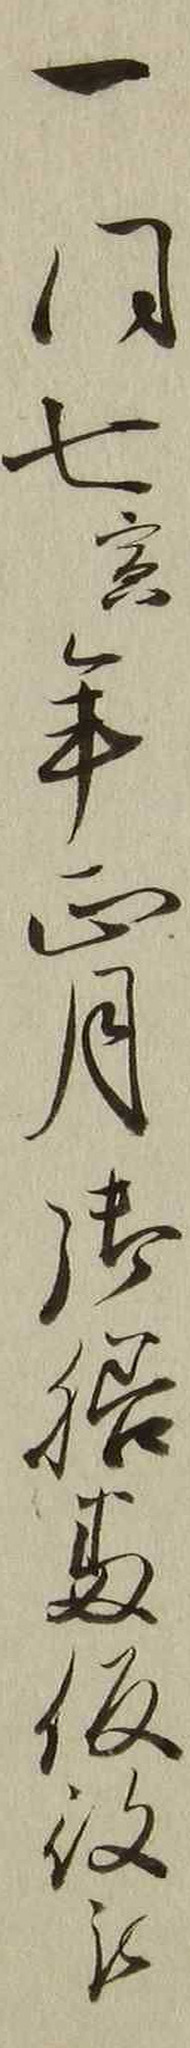一同七寅年正月御膳番仮役被
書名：諸士系譜　巻之103　か之部11
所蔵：会津若松市立会津図書館
